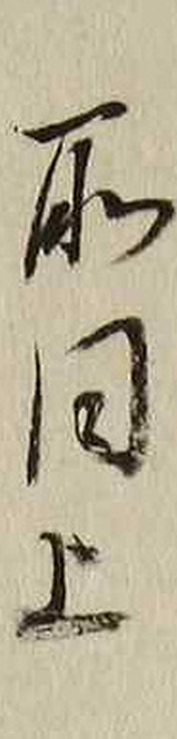所同上
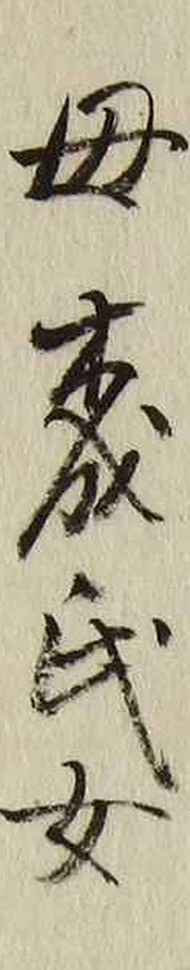母森氏女
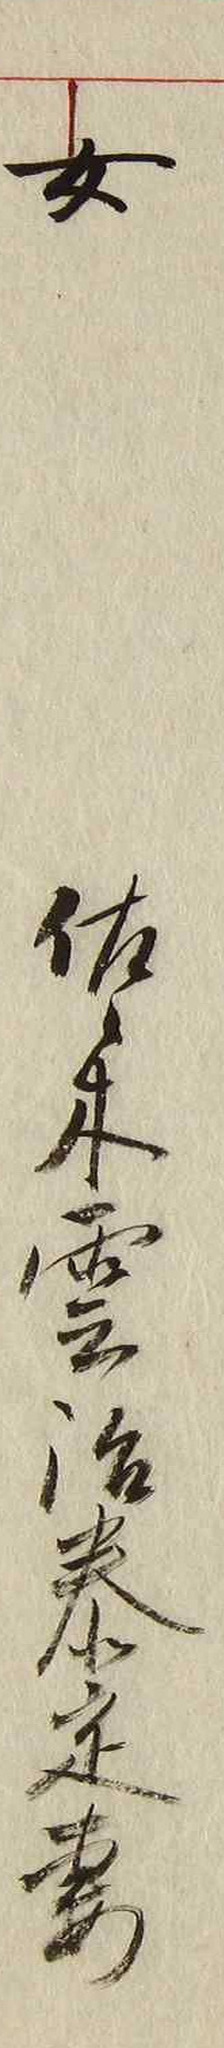女佐々木雲治泰定妻
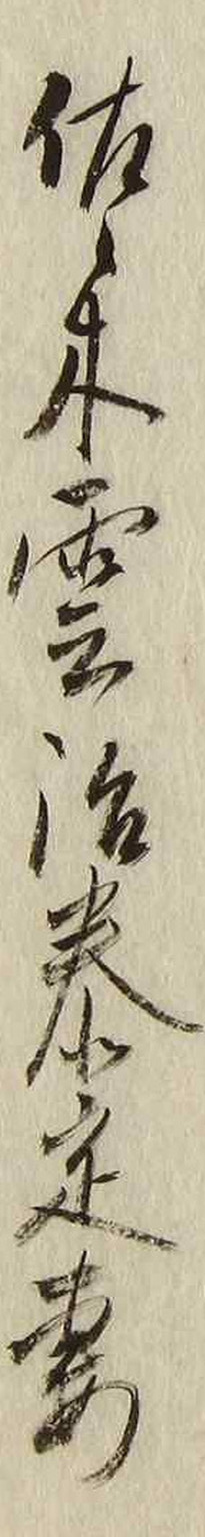女佐々木雲治泰定妻
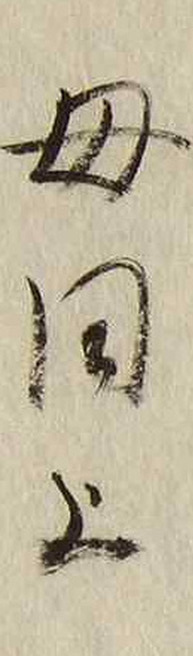母同上

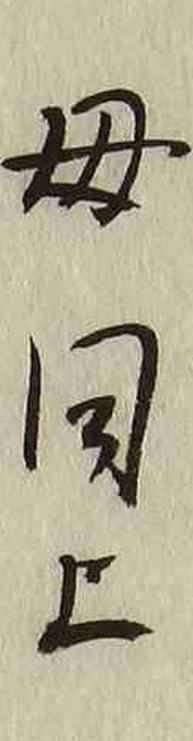母同上
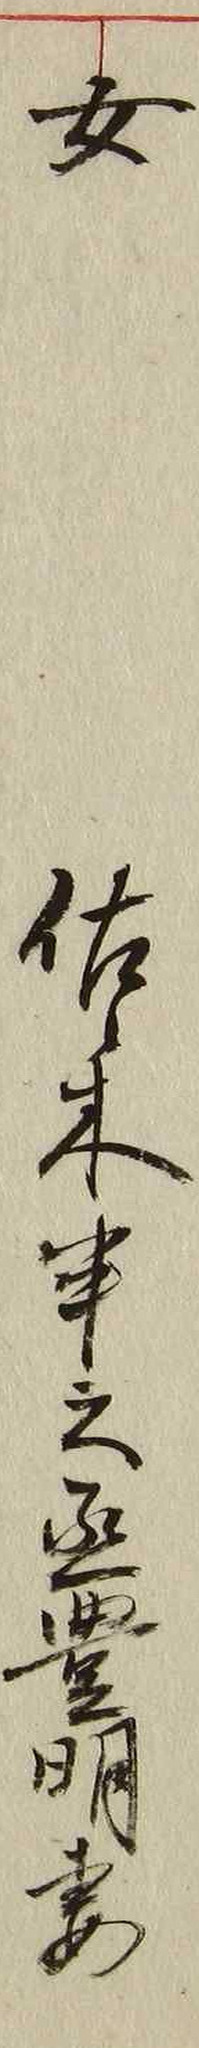女佐々木半之丞豊明妻
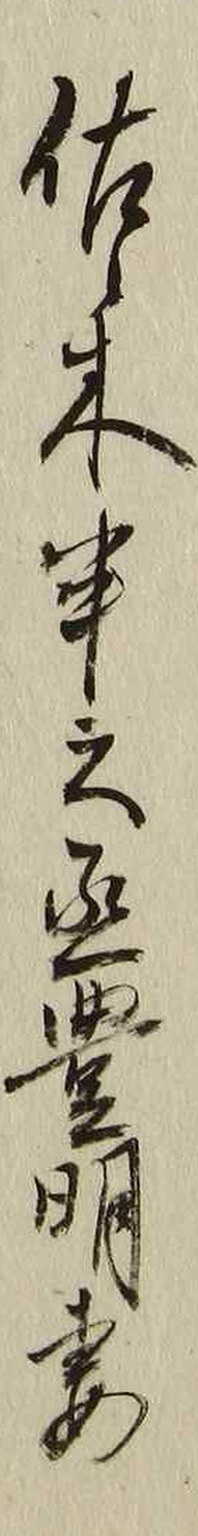女佐々木半之丞豊明妻
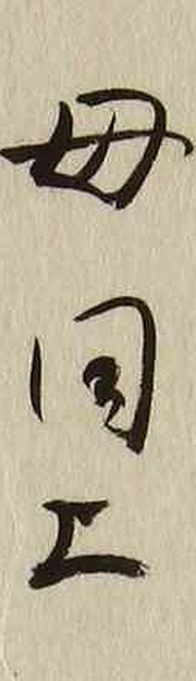母同上
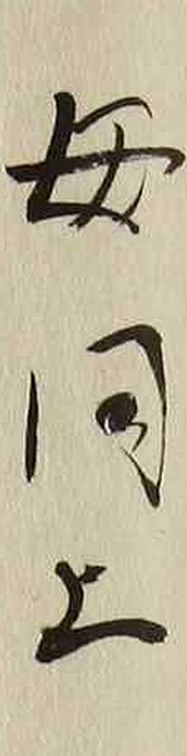母同上
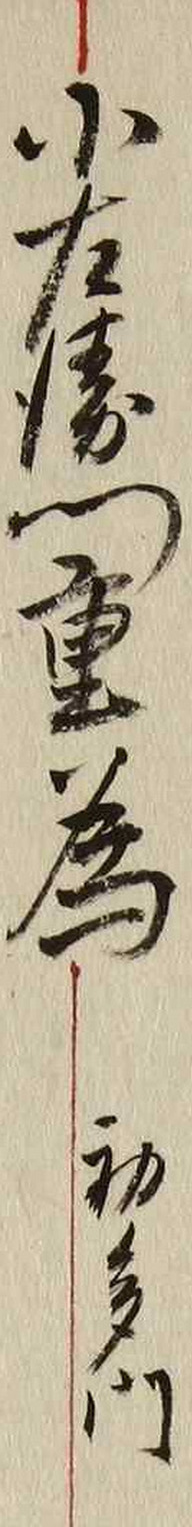小左衛門重為初多門
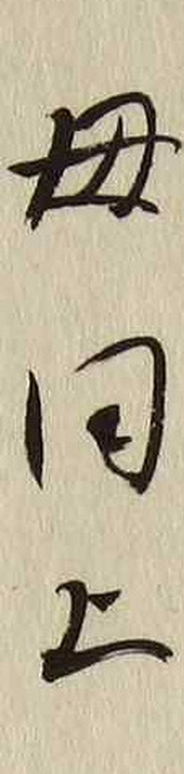母同上
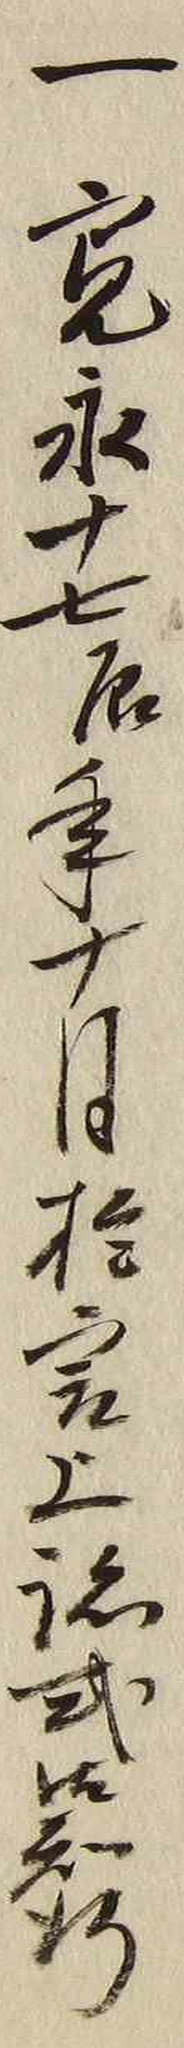一寛永十七辰年十月於最上跡式御知行
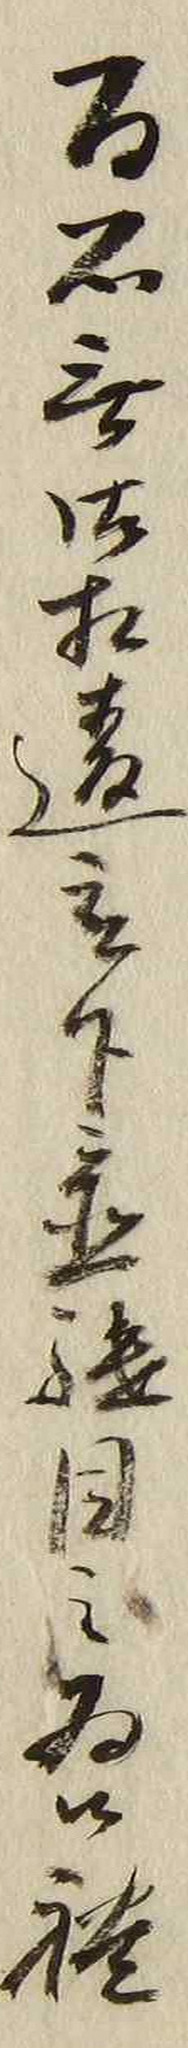百石無御相違被下置継目之為御礼

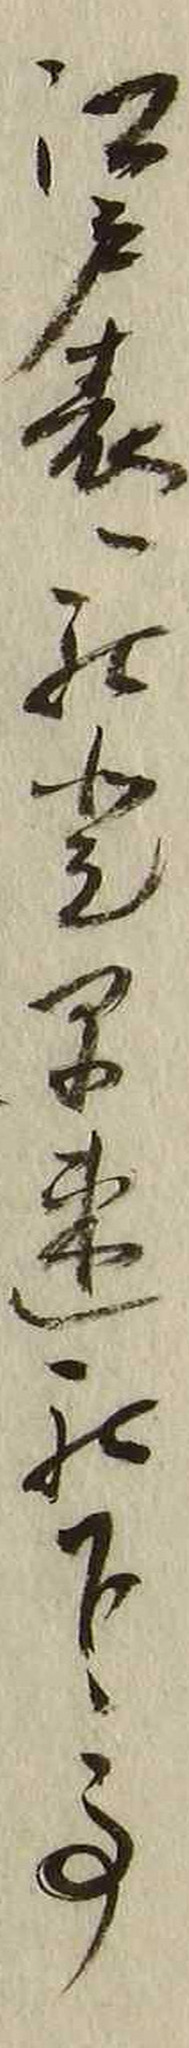江戸表へ罷登早速罷下候事
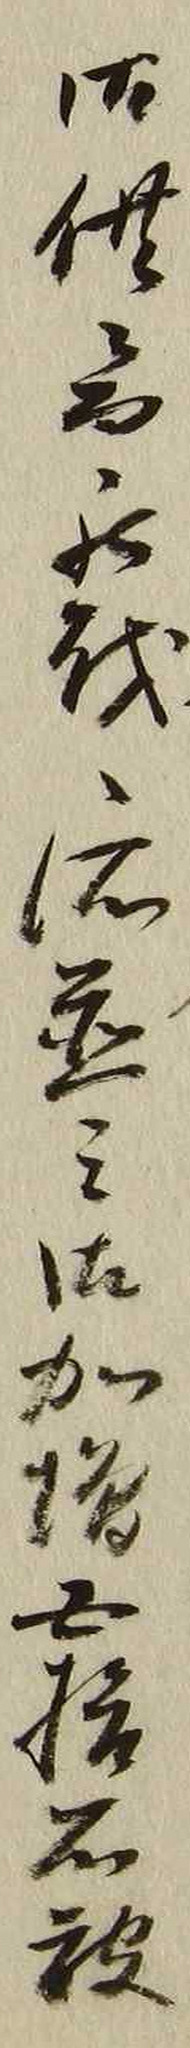御供ニ而罷越候処並之御加増五拾石被
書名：諸士系譜　巻之352　す之部2
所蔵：会津若松市立会津図書館
